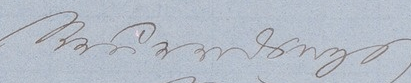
Neuerdings
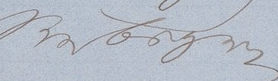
Nebiger
